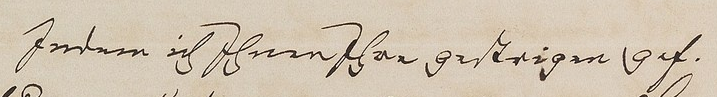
Indem ich Ihnen Ihre gestrigen gef.
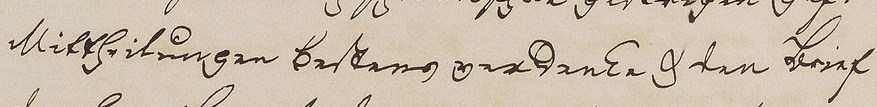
Mittheilungen bestens verdanke & den Brief
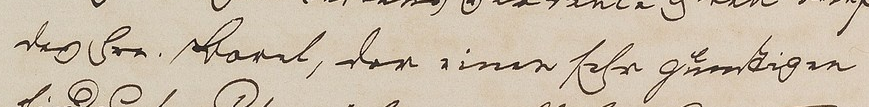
des Hrn. Borel, der einen sehr günstigen
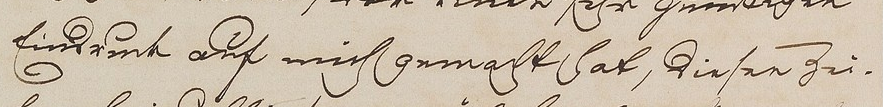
Eindruck auf mich gemacht hat, diesen Zei-
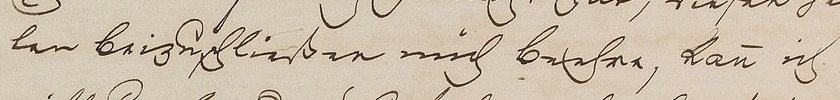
len beizuschließen mich beehre, kann ich
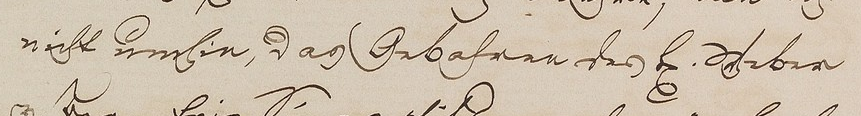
nicht umhin, das Gebahren des H. Weber
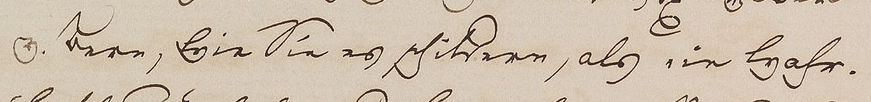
v. Bern, wie Sie es schildern, als ein wahr-
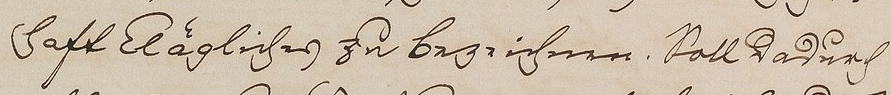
haft klägliches zu bezeichnen. Soll dadurch
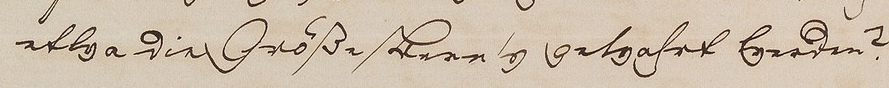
etwa die Größe Bern's gewahrt werden?
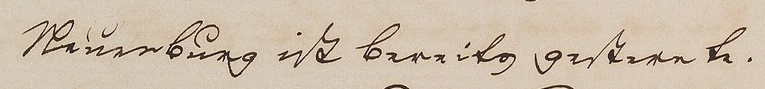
Neuenburg ist bereits gestern te-
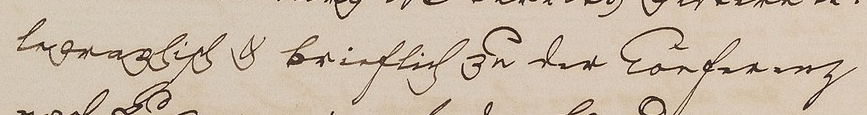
legraphisch & brieflich zu der Conferenz
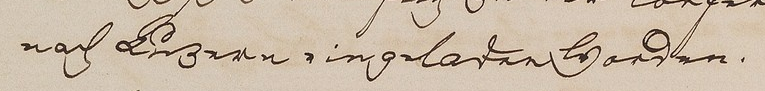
nach Luzern eingeladen worden.
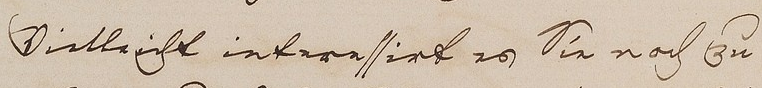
Vielleicht interessirt es Sie noch zu
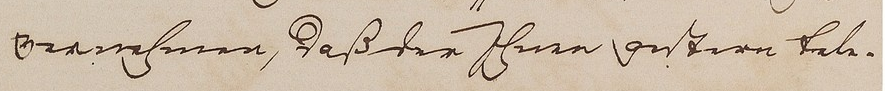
vernehmen, daß der Ihnen gestern tele-
